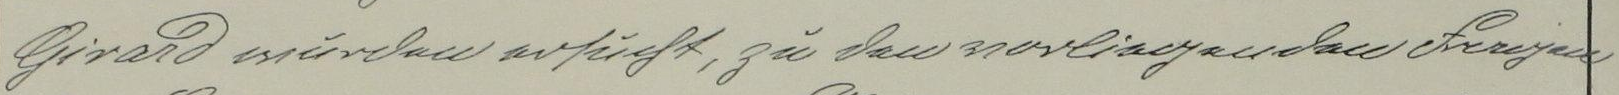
Girard wurden ersucht, zu den vorliegenden Fragen
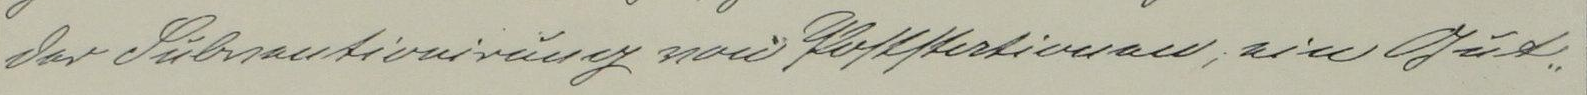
der Subventionierung von Poststationen, ein Gut-
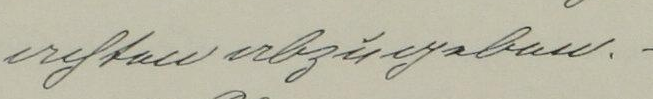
achten abzugeben.
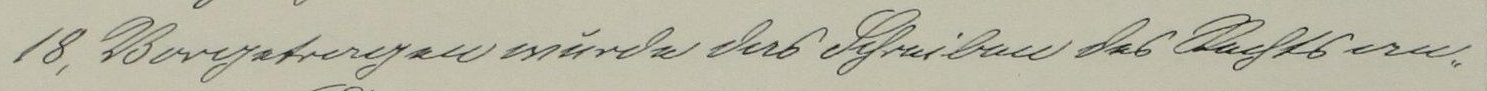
18. Vorgetragen wurde das Schreiben des Rechtsan-
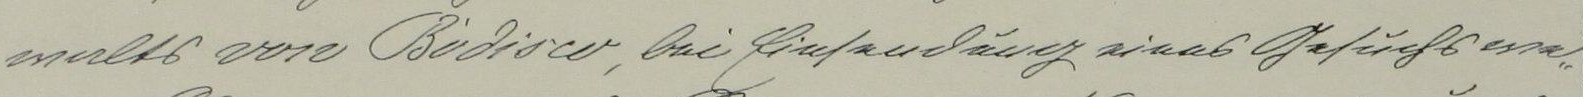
walts von Bodisco, bei Einsendung eines Gesuchs we-
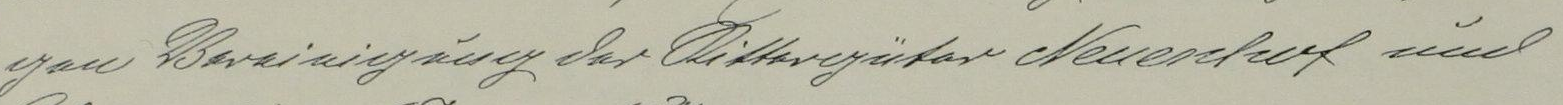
gen Vereinigung der Rittergüter Neuenhof und
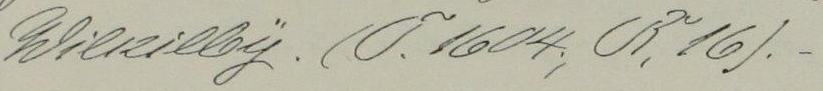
Wilkilby. (T.1604; R.16).
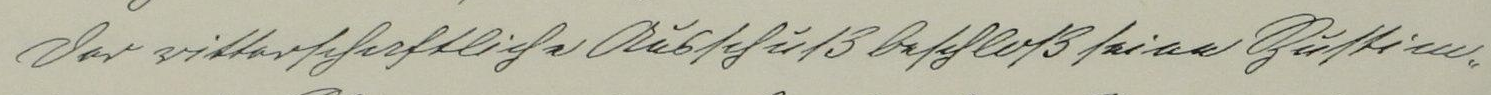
Der ritterschaftliche Ausschuß beschloß seine Zustim-
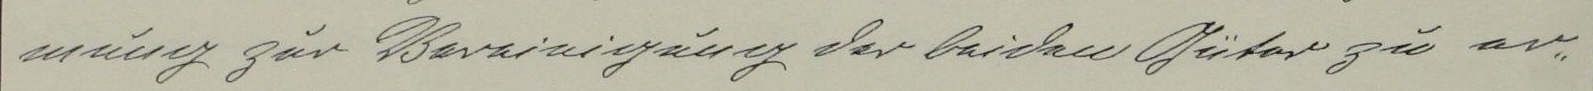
mung zur Vereinigung der beiden Güter zu er-
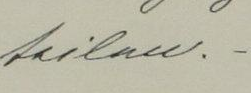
teilen.
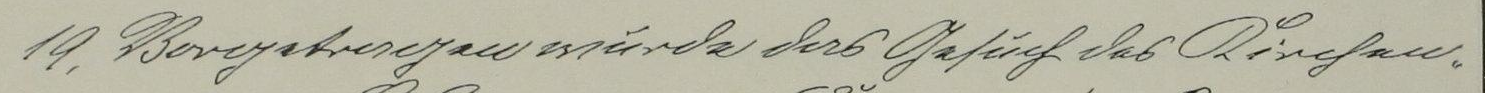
19. Vorgetragen wurde das Gesuch des Kirchen-
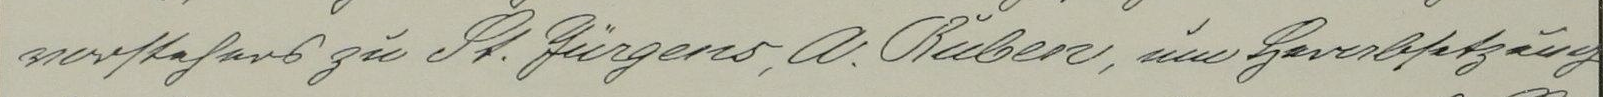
vorstehers zu St. Jürgens, A. Ruben, um Herabsetzung
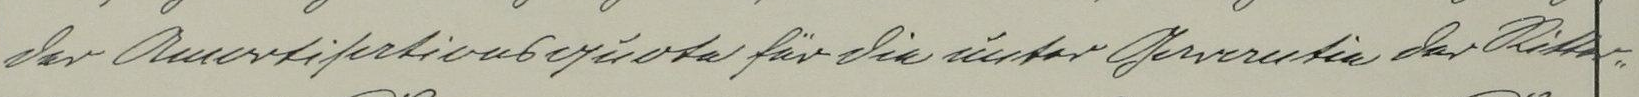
der Amortisationsquote für die unter Garantie der Ritter-
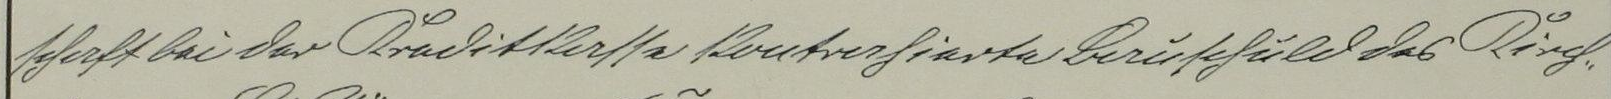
schaft bei der Kreditkasse kontrahierte Bauschuld des Kirch-
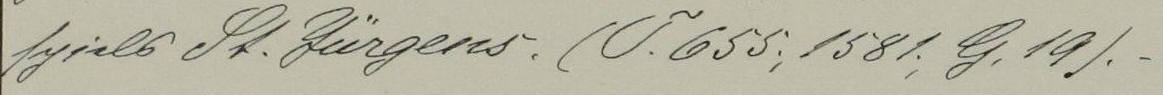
spiels St. Jürgens. (T.655; 1581; G. 19).
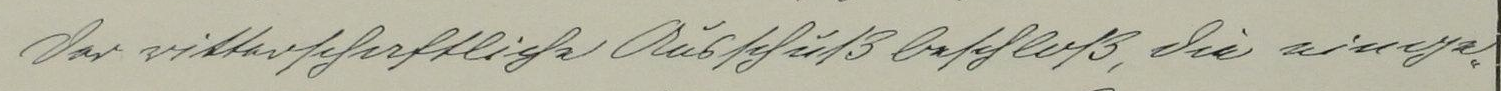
Der ritterschaftliche Ausschuß beschloß, die einge-
